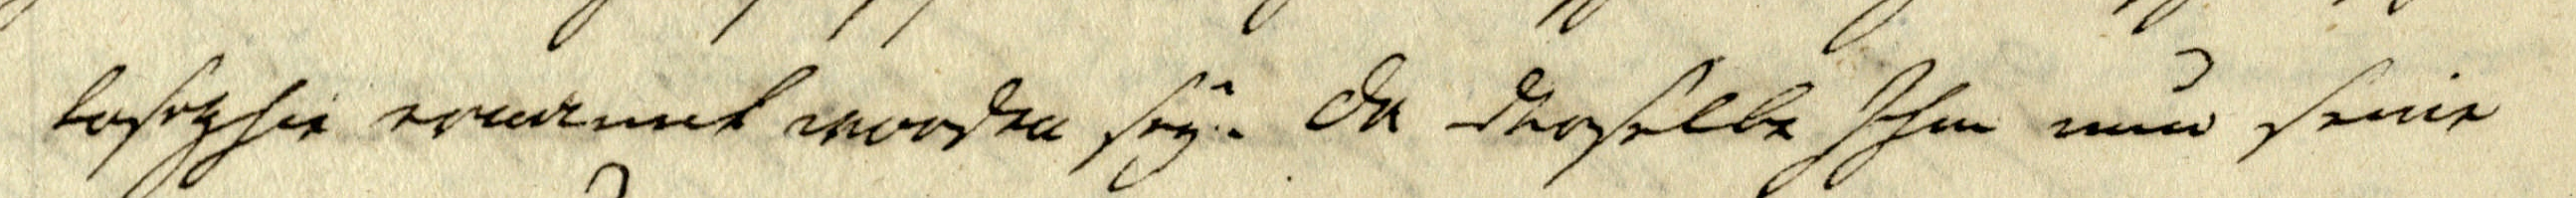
losophie ernannt worden seÿ. Da derselbe Ihm nun seine
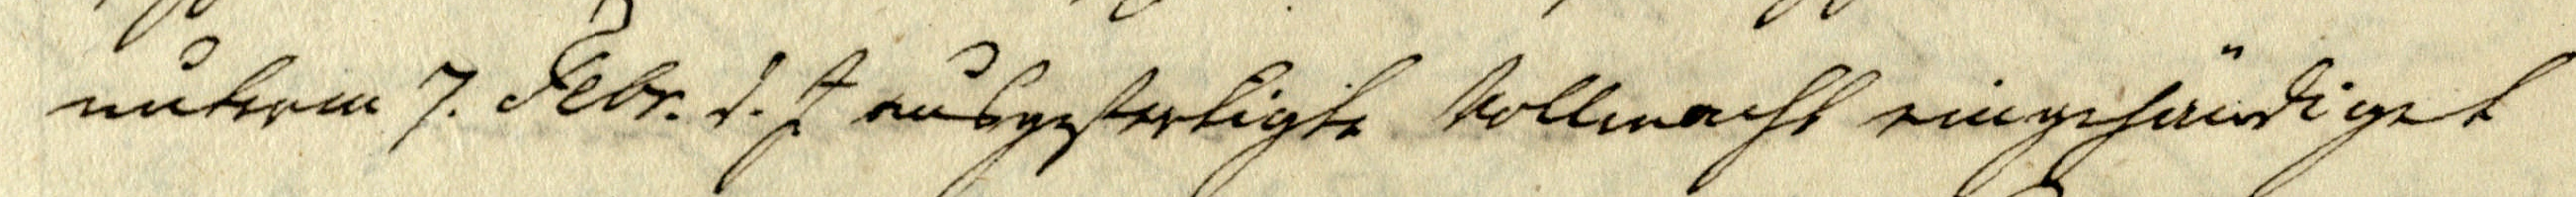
unterm 7. Febr. d. J. ausgefertigte Vollmacht eingehändiget
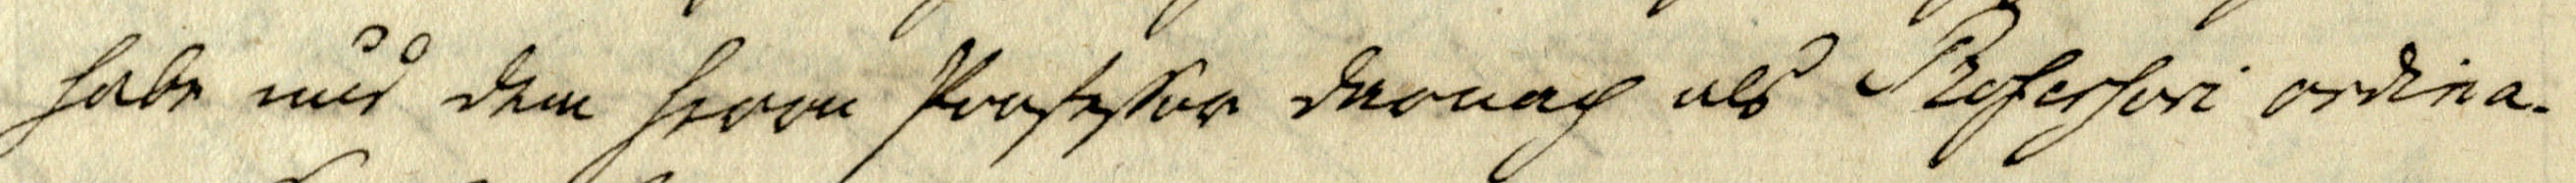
habe und dem herrn Professor darnach als Professori ordina¬
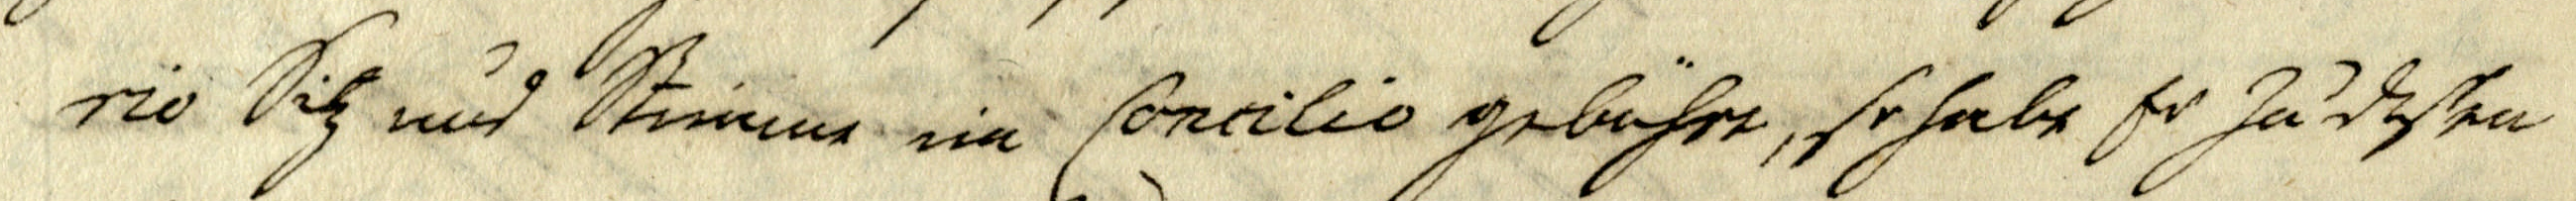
rio Sitz und Stimme im Concilio gebühre, so habe Er zu dessen
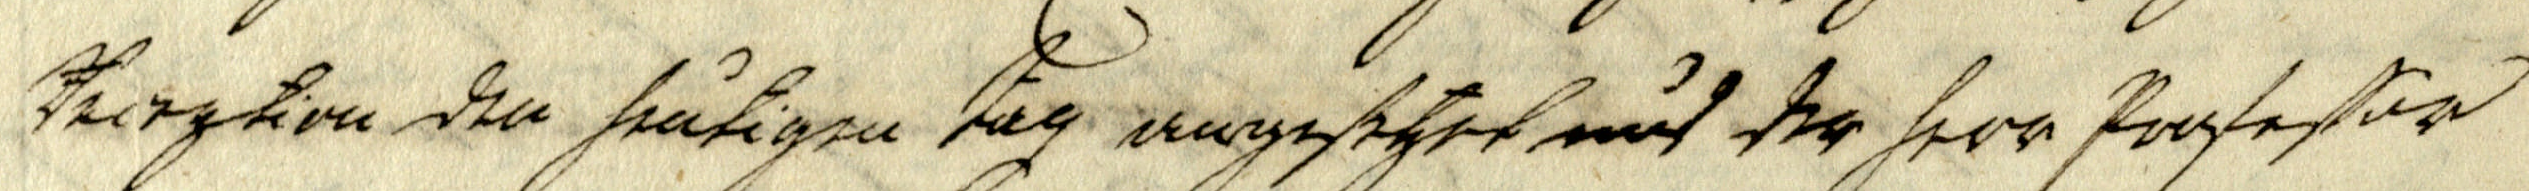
Reception den heutigen Tag angesetzet und der herr Professor
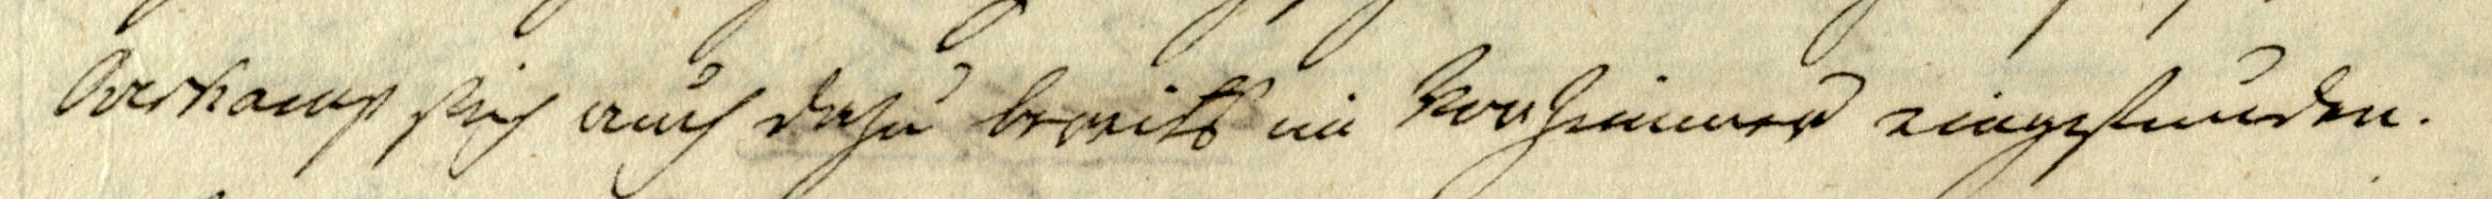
Overkamp sich auch dazu bereits im Vorzimmer eingefunden.
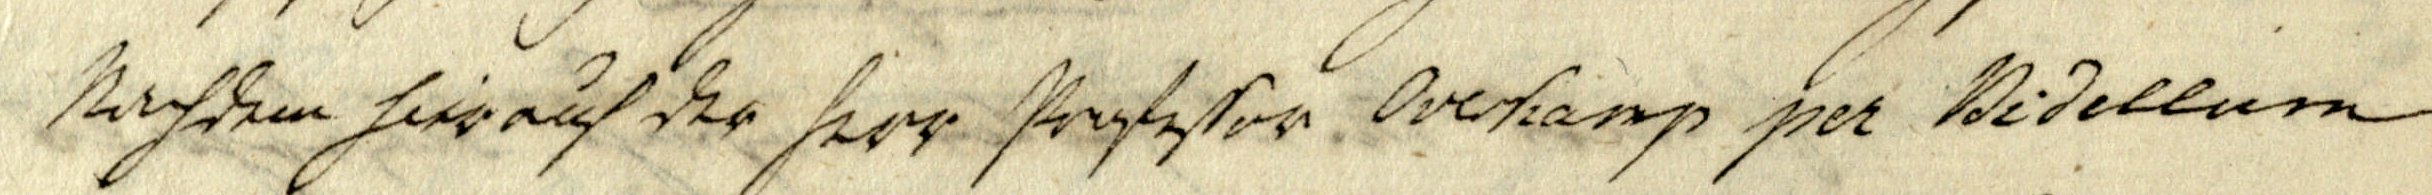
Nachdem hierauf der herr Professor Overkamp per Bidellum
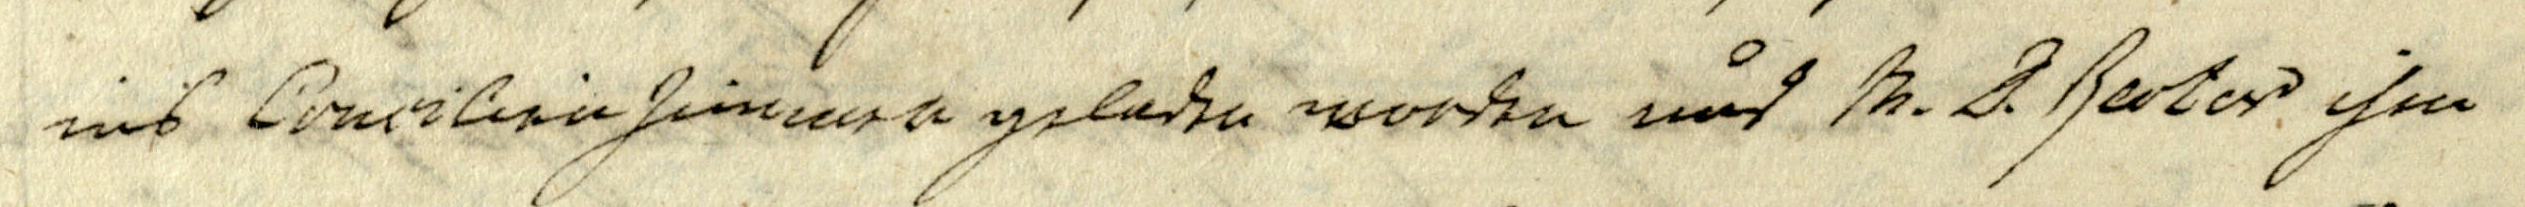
ins Concilien Zimmer geladen worden und M. D. Rector ihm
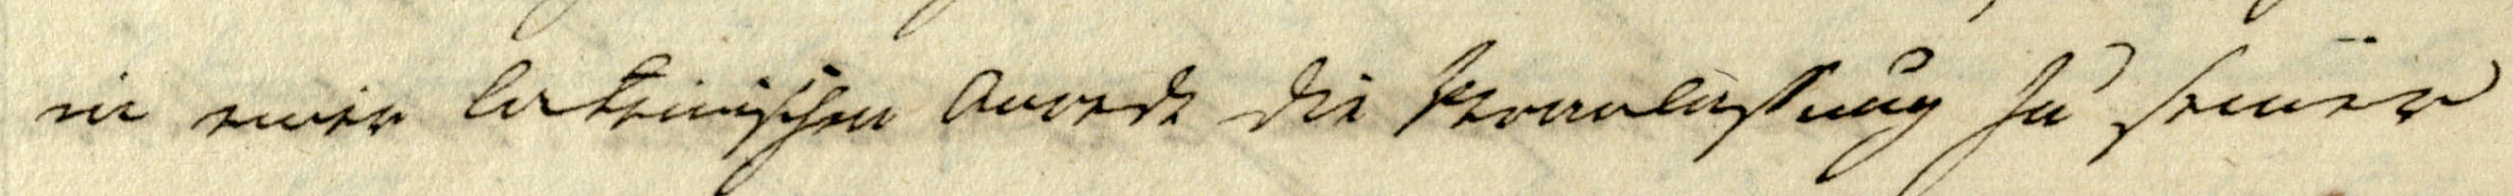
in einer lateinischen Anrede die Veranlassung zu seiner
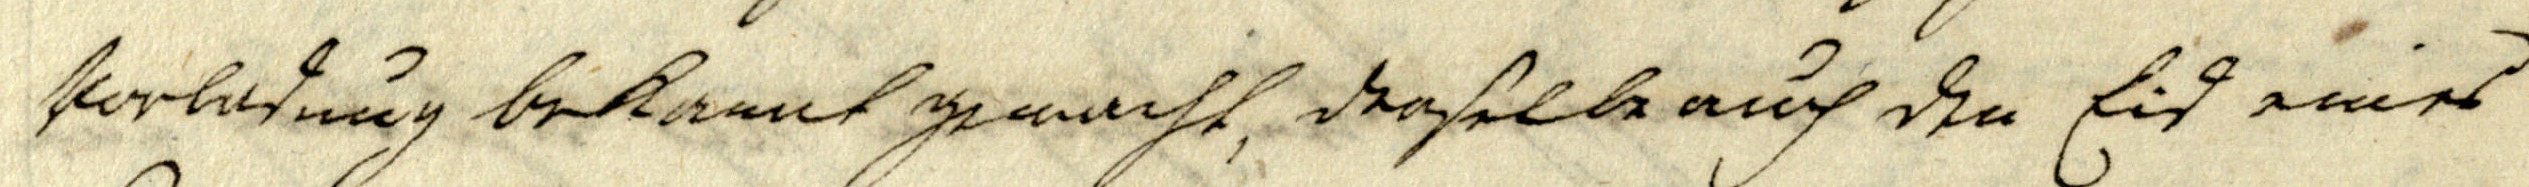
Vorladung bekannt gemacht, derselbe auch den Eid eines
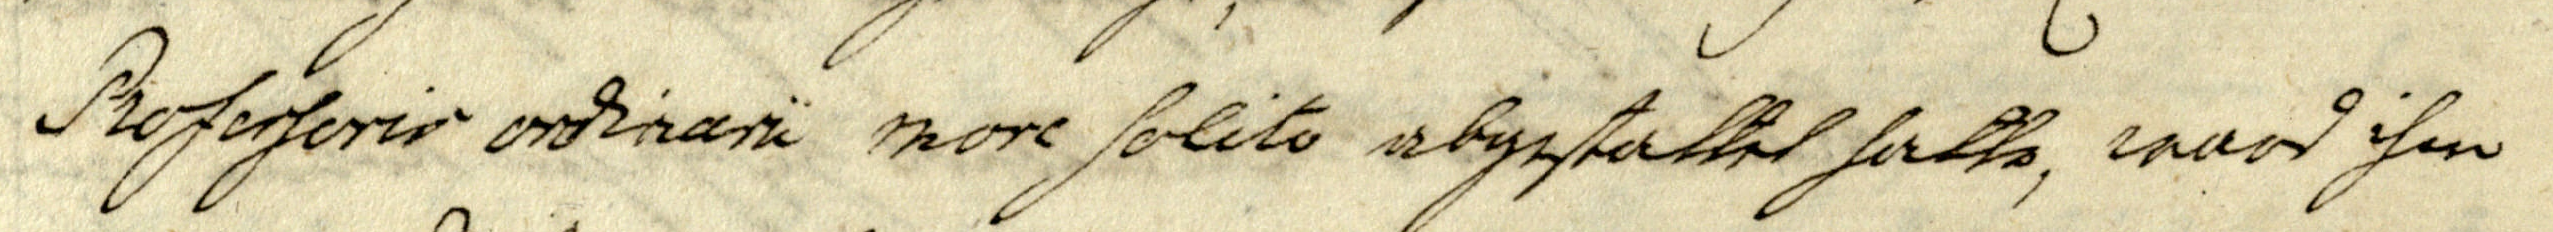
Professoris ordinarii more solito abgestattet hatte, ward ihm
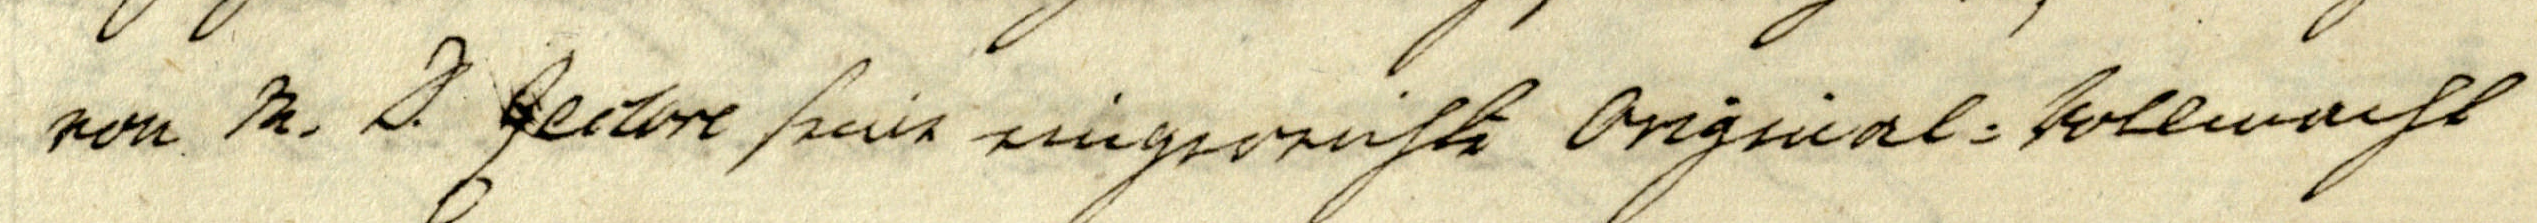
von M. D. Rectore seine eingereichte Original-Vollmacht
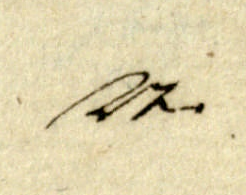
re.
